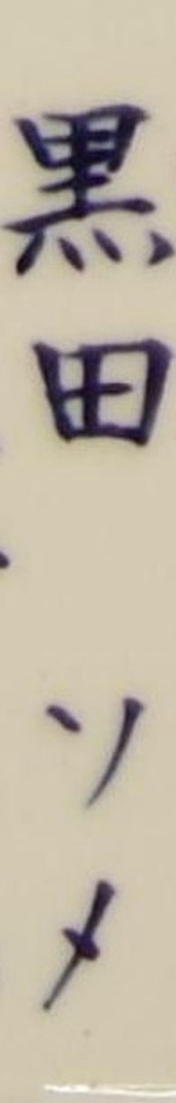黒田ソメ
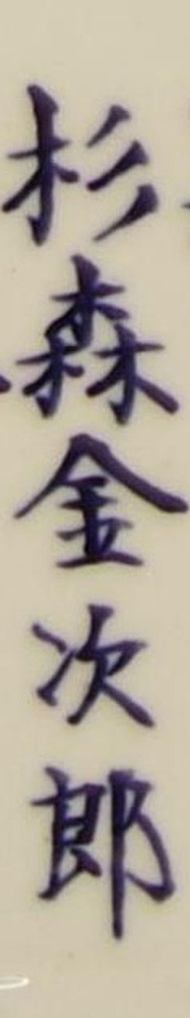杉森金次郎
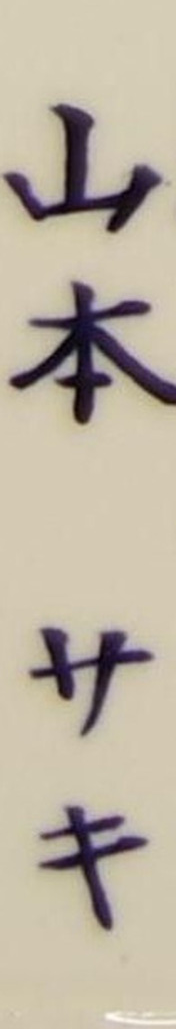山本サキ
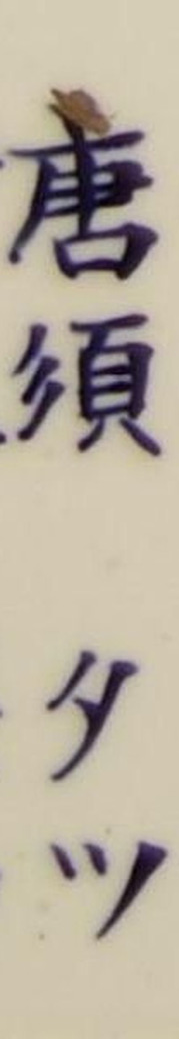唐須タツ
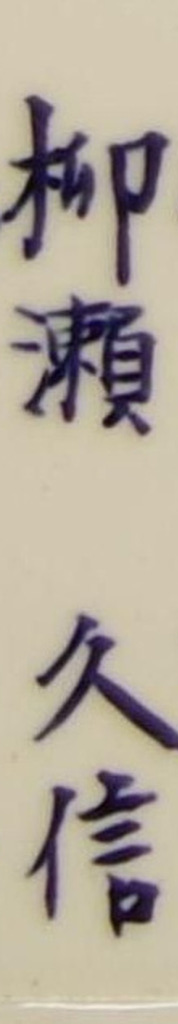柳瀬久信

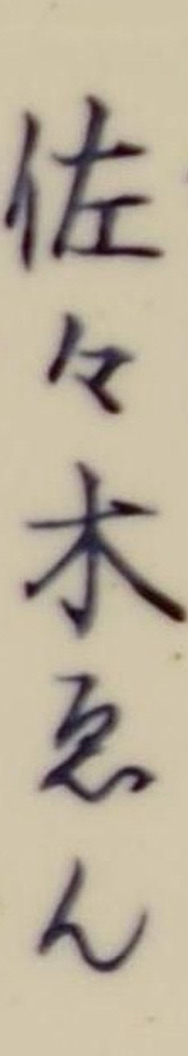佐々木ゑん
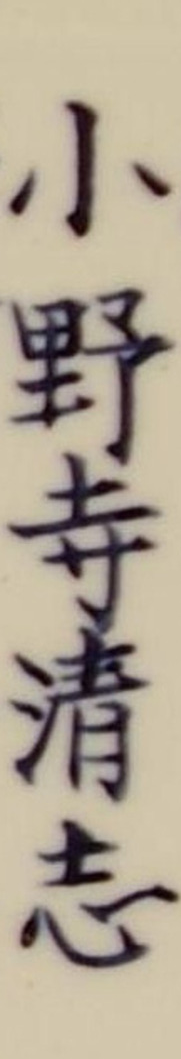小野寺清志
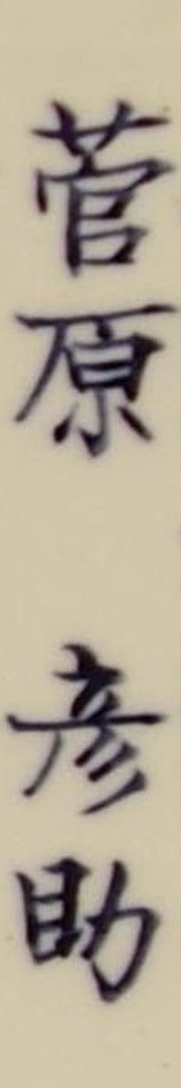菅原彦助
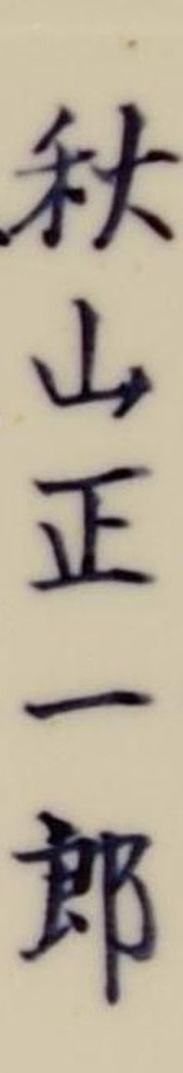秋山正一郎
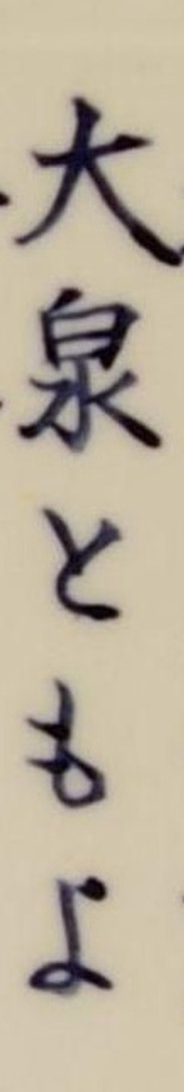大泉ともよ
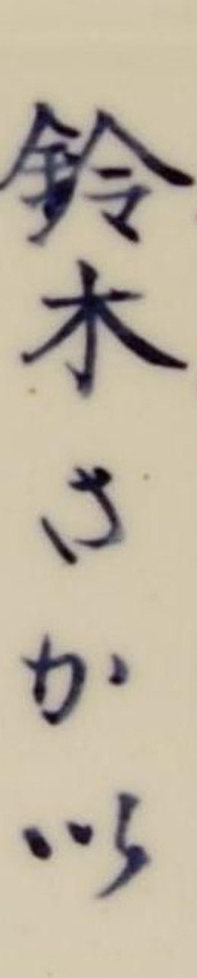鈴木さかい
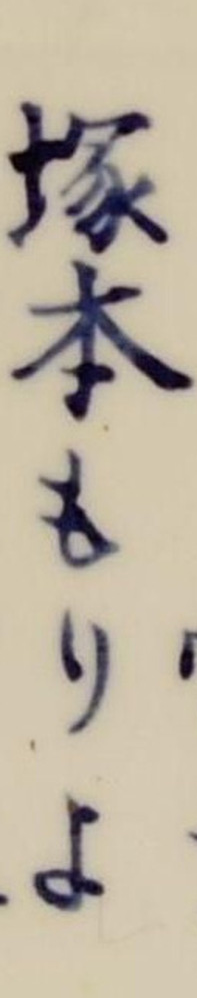塚本もりよ
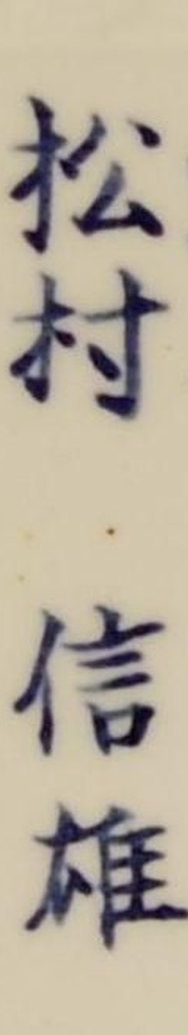松村信雄
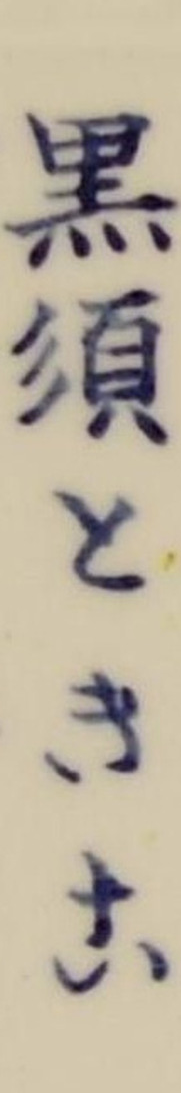黒須ときこ
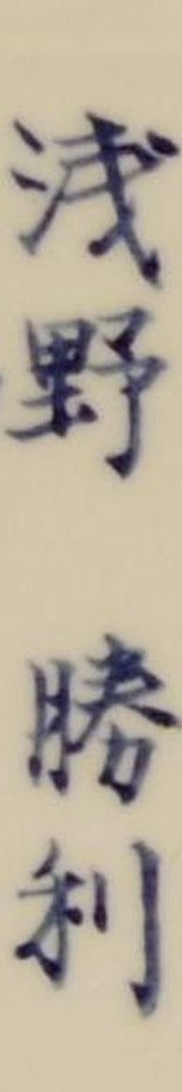浅野勝利
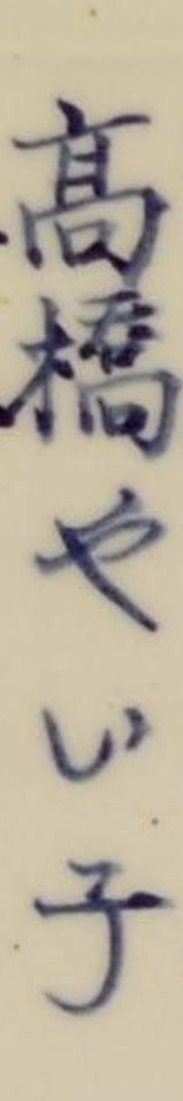高橋やい子
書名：A~D
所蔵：koyasan kongobuji
